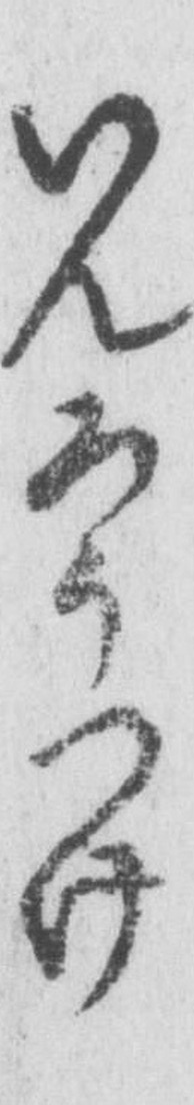いんろうつけ
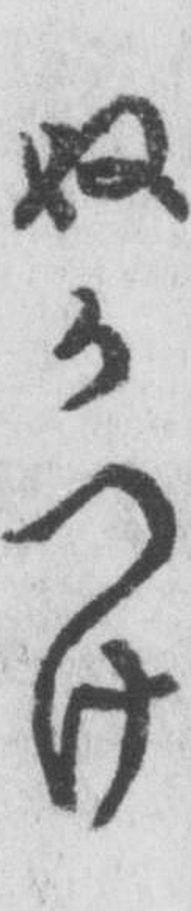ぬかつけ
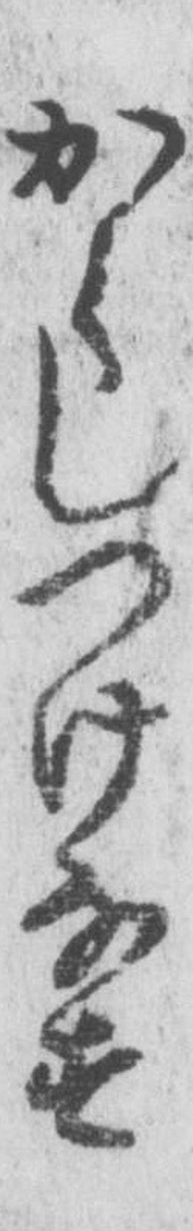からしつけなす
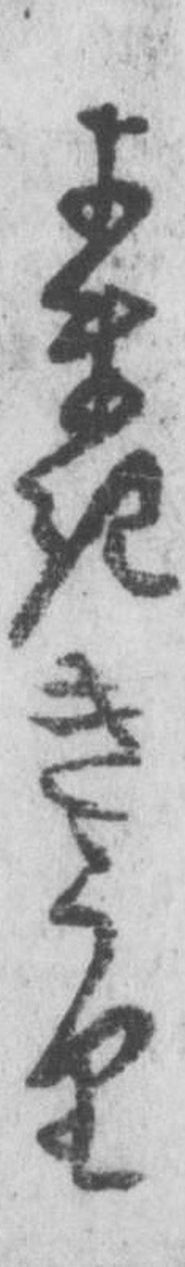よまききうり
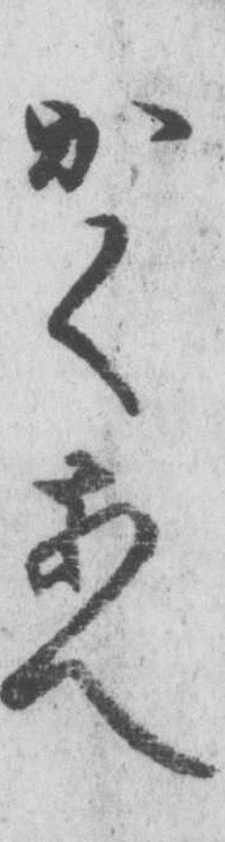かくあへ

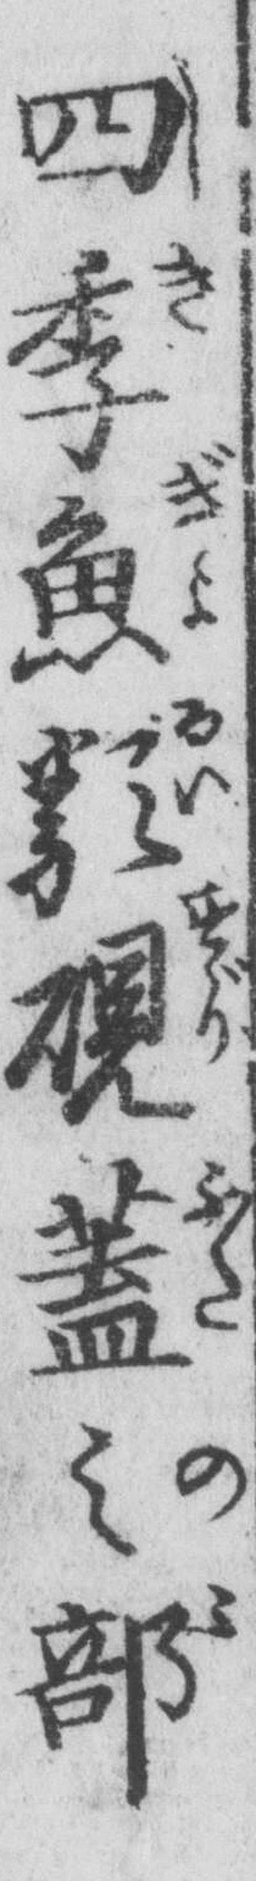四季魚類硯蓋之部
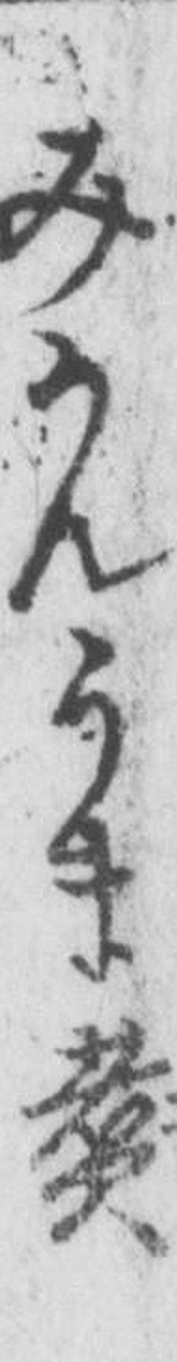みかんうま煮
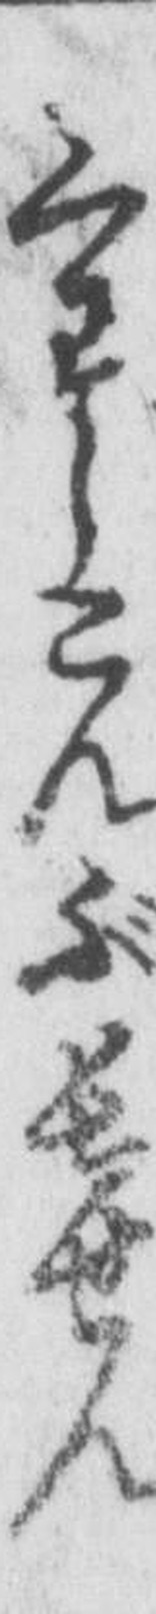くわしこんぶ長せん
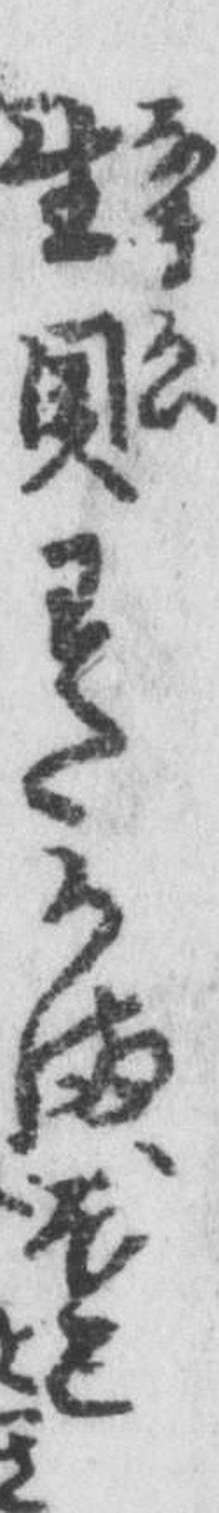生貝わたかまぼこ
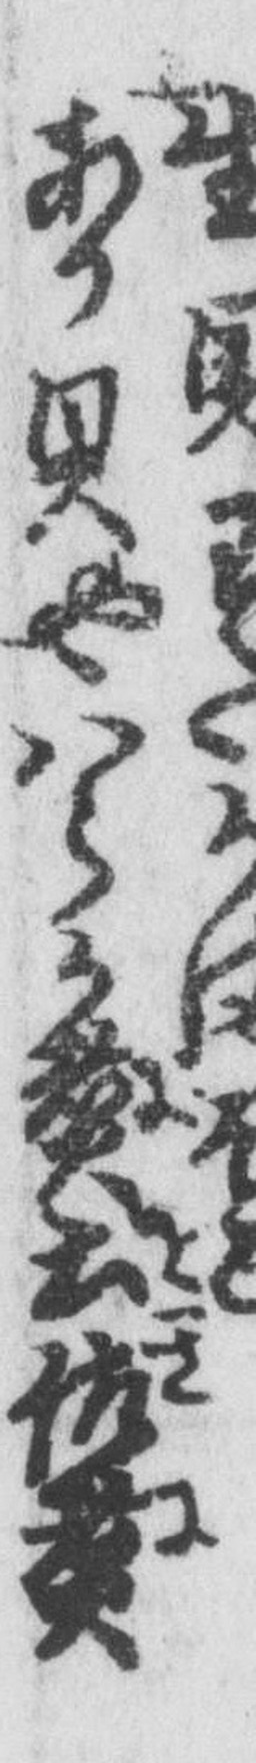あか貝やハらか煮土佐煮
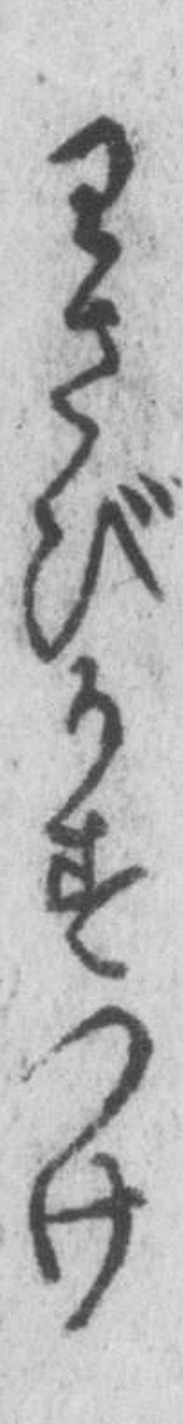わさびかすつけ

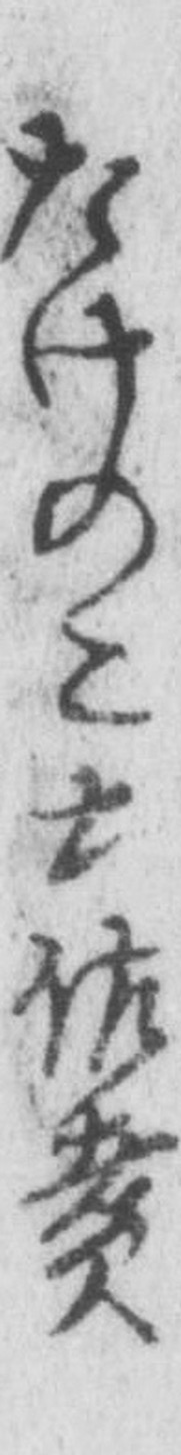たけのこ土佐煮
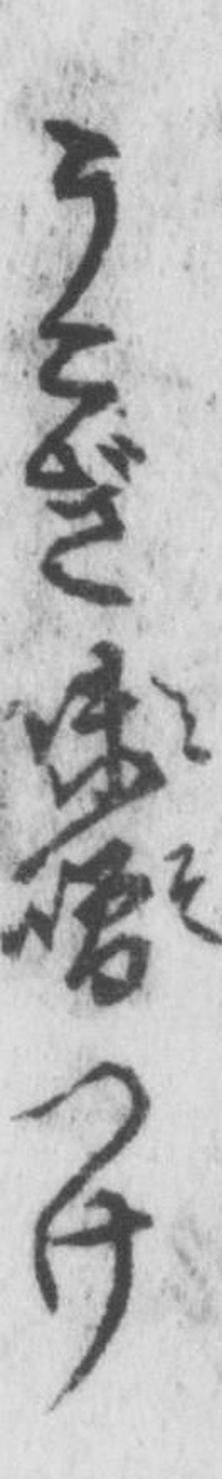うこぎ味噌つけ
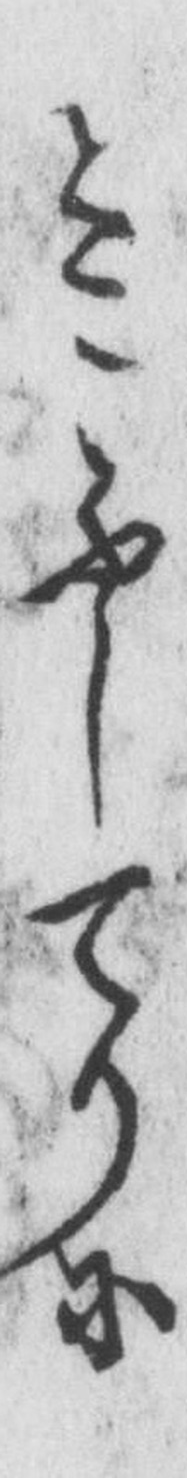五とこふしてりに
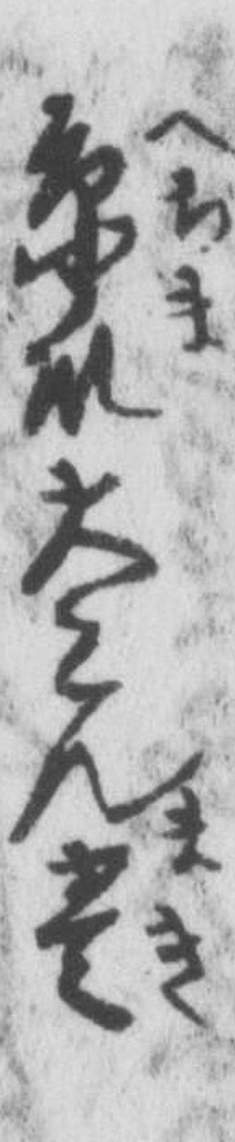糸瓜大こん巻
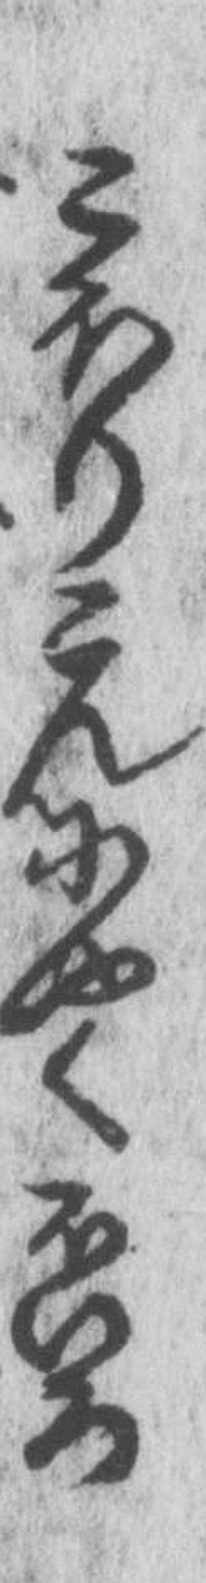こほりこんにやくほいろ
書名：当世料理献立
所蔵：大阪府立大学学術情報センター 国文学研究資料館
